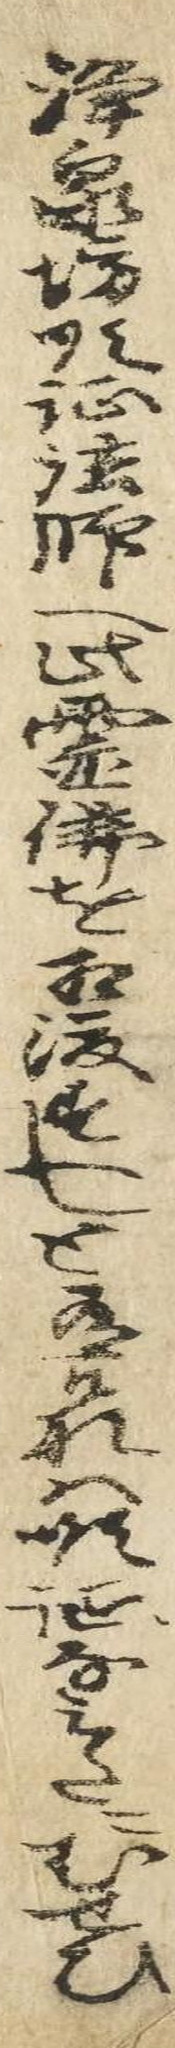浄泉坊順証法師へ此霊仏を相渡すへしと有けれは順証なみたにむせひ
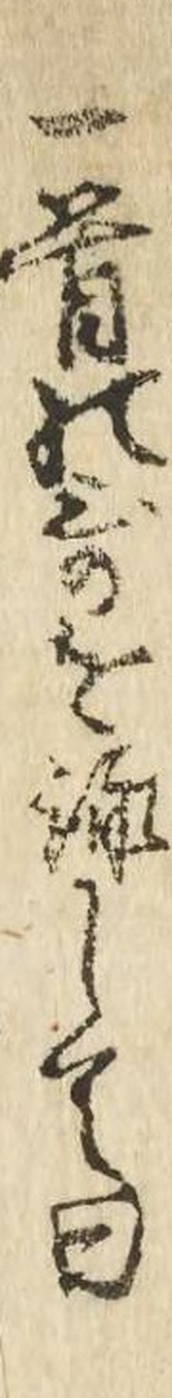一首の哥を詠して曰
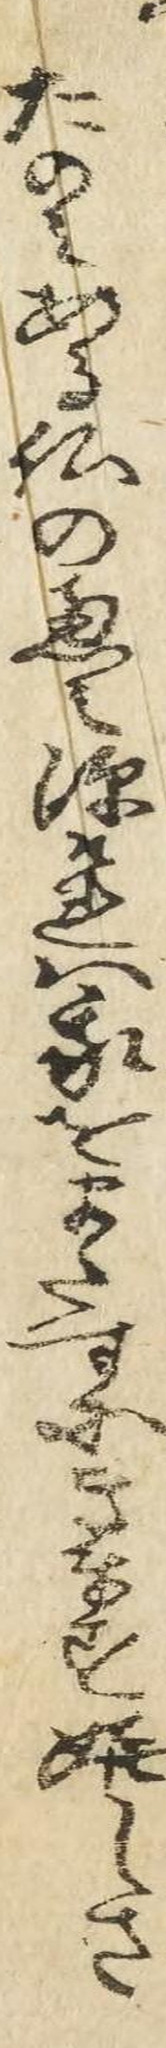たのみある仏の恵み深けれは我をまたすにきます嬉しさ
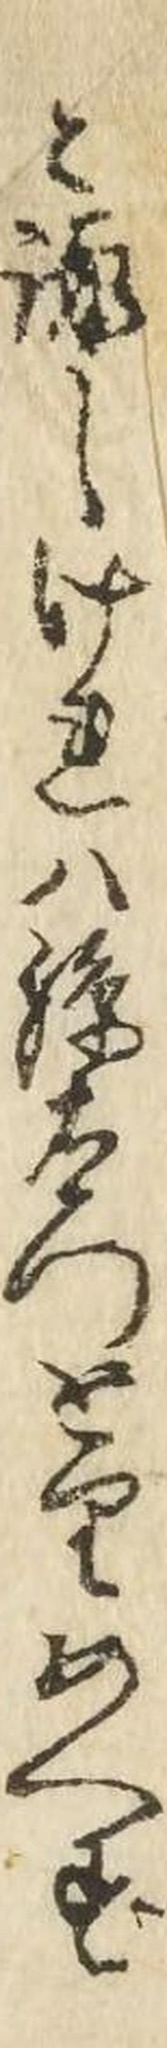と詠しけれは孫右衛門とりあへず
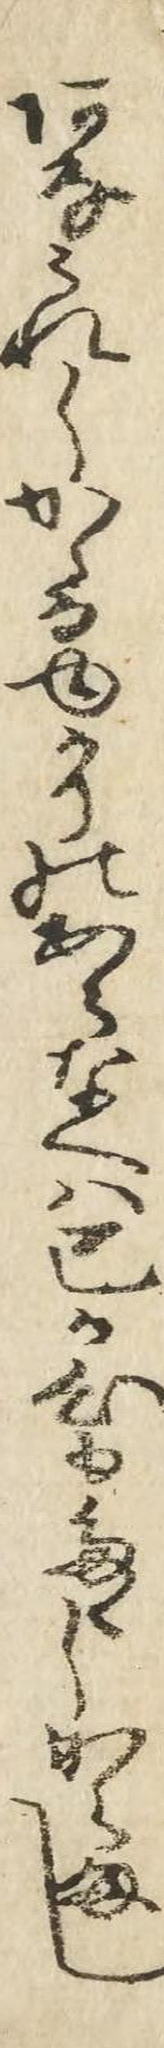あなうれしかゝるゆかりのあらなくは己か心もたゝしからまし
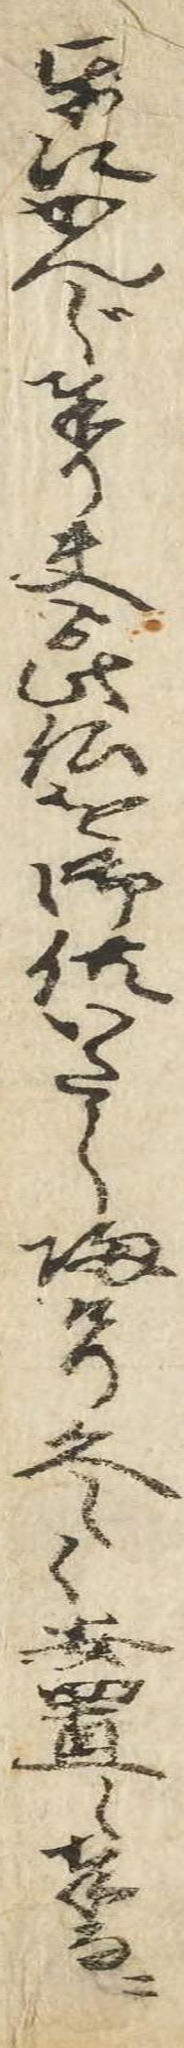互にかんじ奉り夫より此仏を御共いたし帰けり久しく安置し奉るに
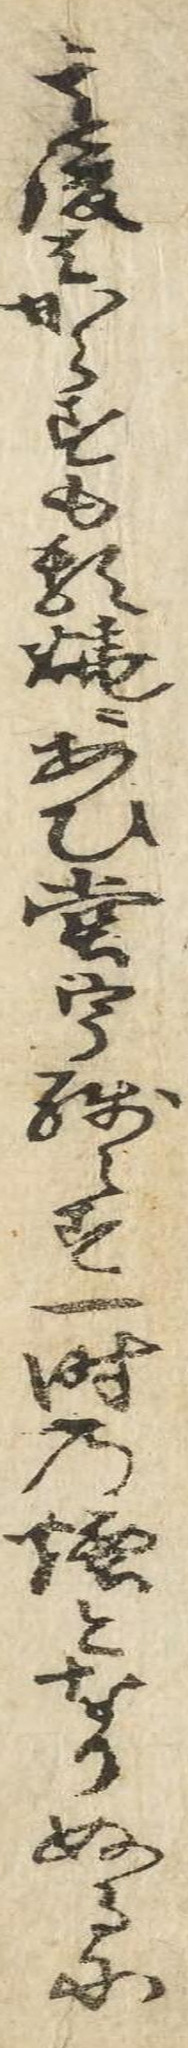其後はからすも類焼にあひ堂宇を残らす一時の煙となりぬるに
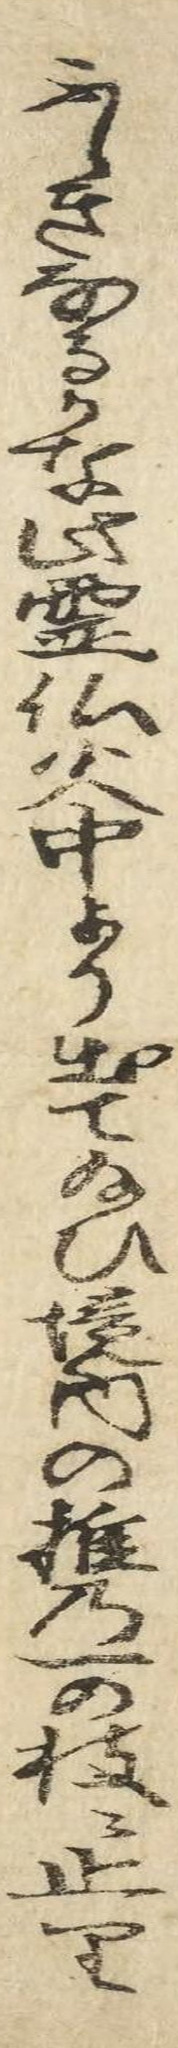ふしきなるかな此霊仏火中より出て給ひ境内の椎の一の枝に止り
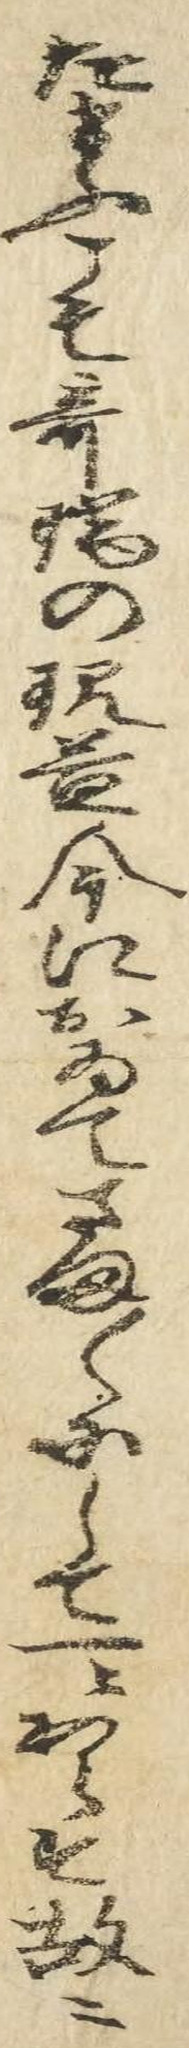たまふこそ奇瑞の現益今におゐてさま〳〵にして一にあらす故に
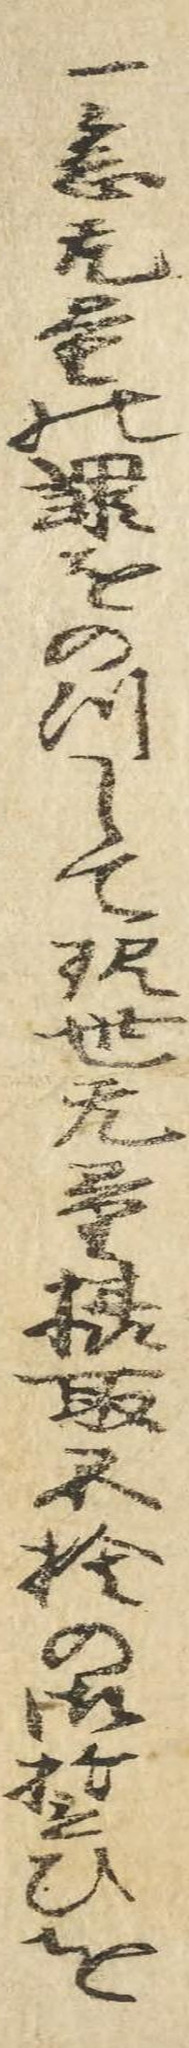一念無量の罪をのつして現世無量摂取不捨の御誓ひを
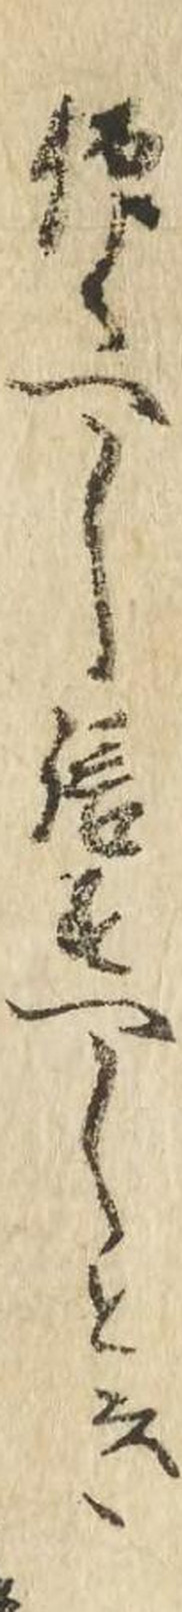仰くへし信すへしと
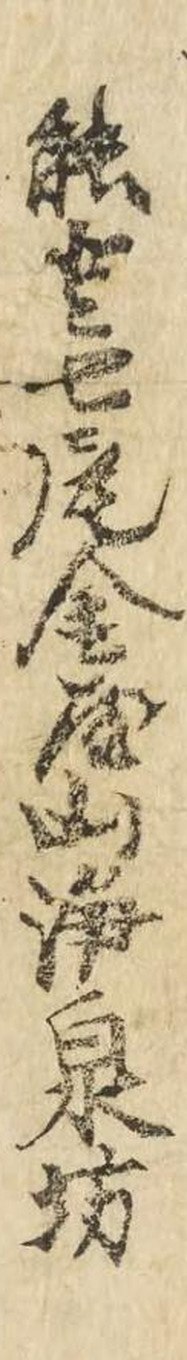能登七尾金屋山浄泉坊

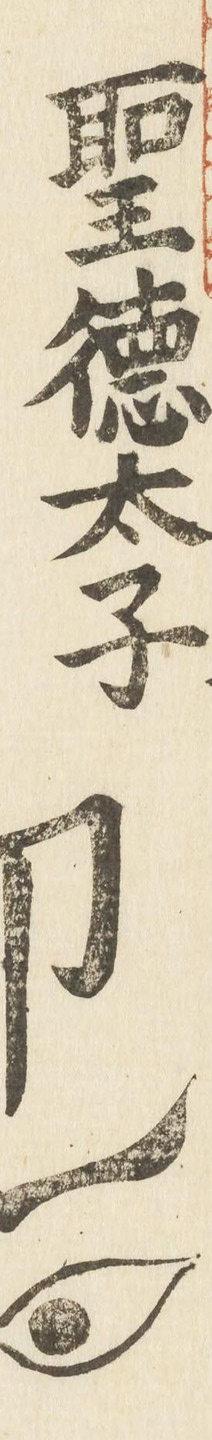聖徳太子
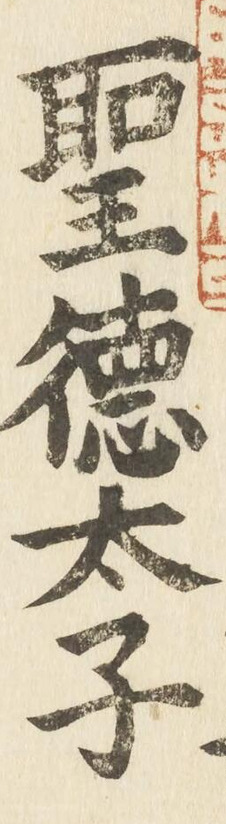聖徳太子
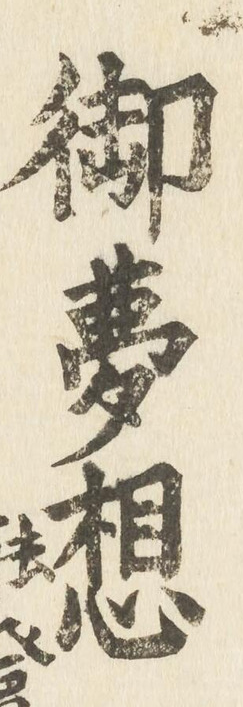御夢想
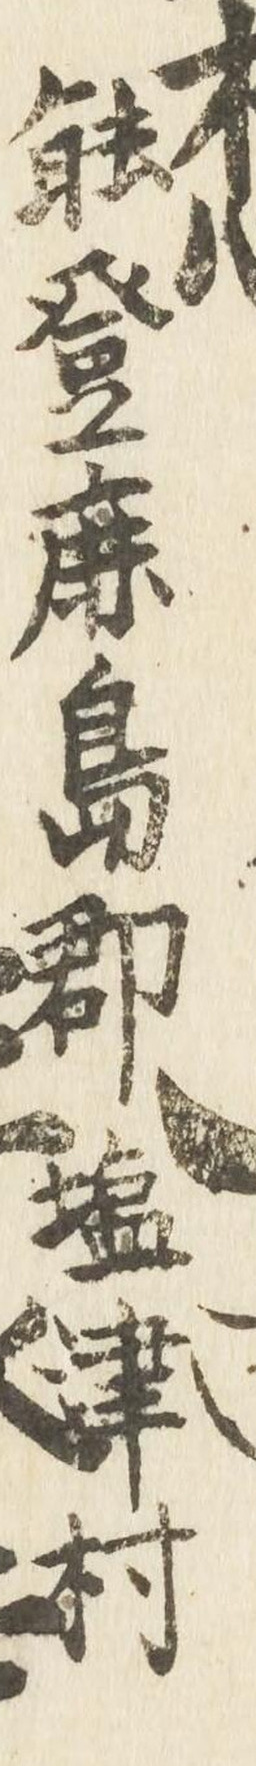能登鹿島郡塩津村
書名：加能真宗聖集
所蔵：Ishikawa Prefectural Library
